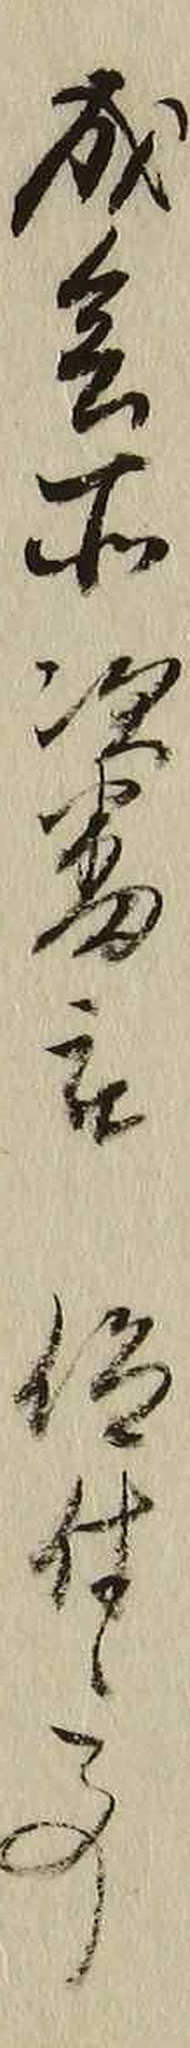成会所次番被仰付候事
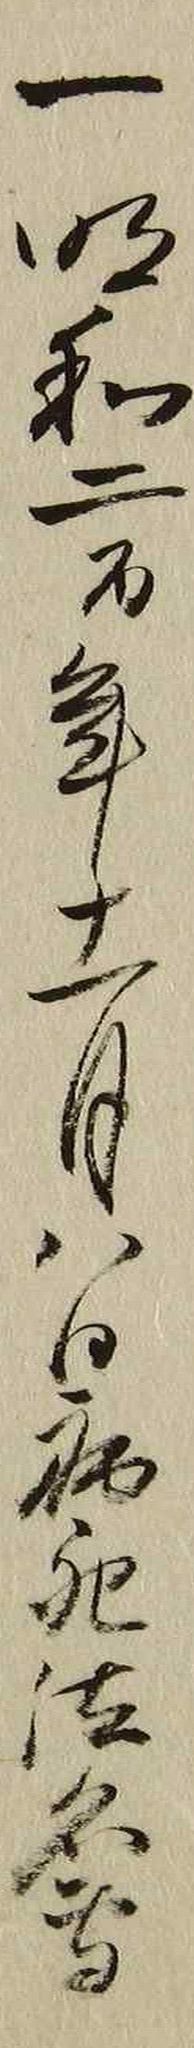一明和二酉年十一月八日病死法名専
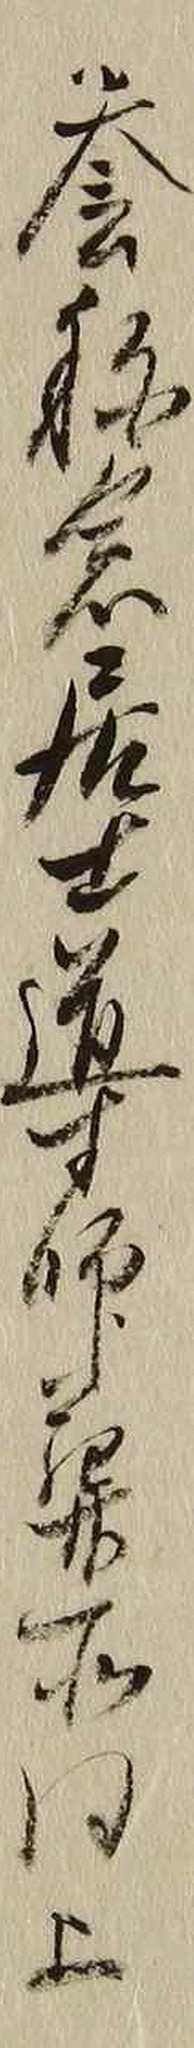誉称念居士導師葬所同上
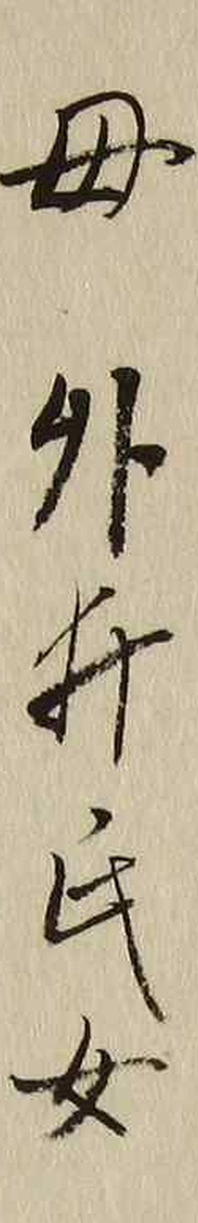母外井氏女
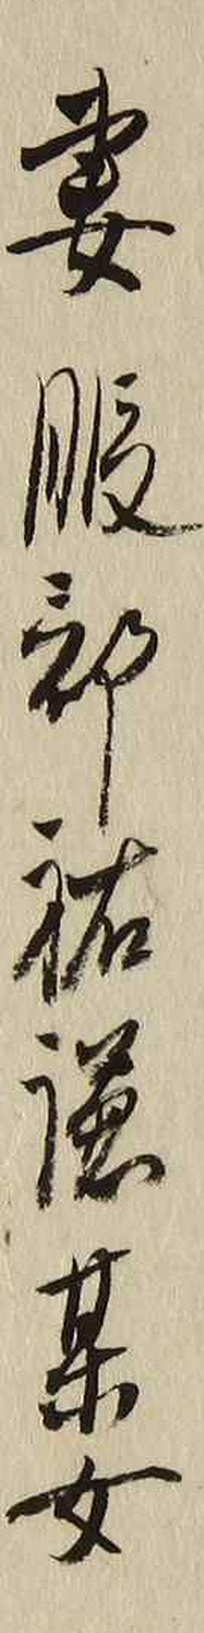妻服部祐謙某女
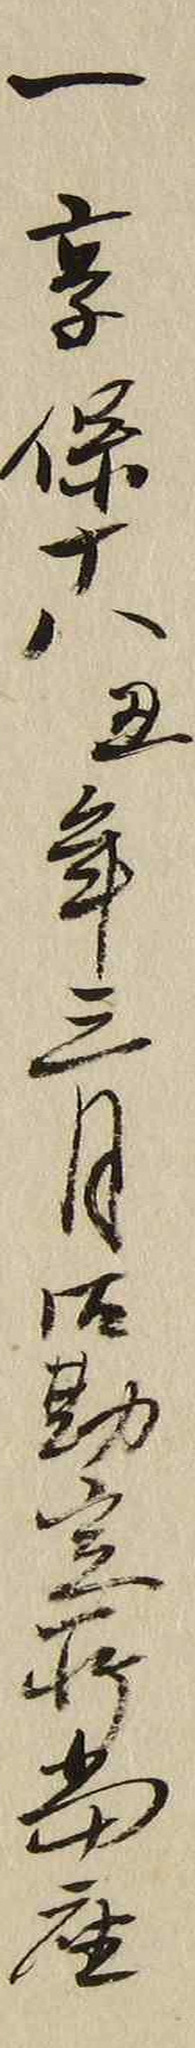一享保十八丑年三月御勘定所当座
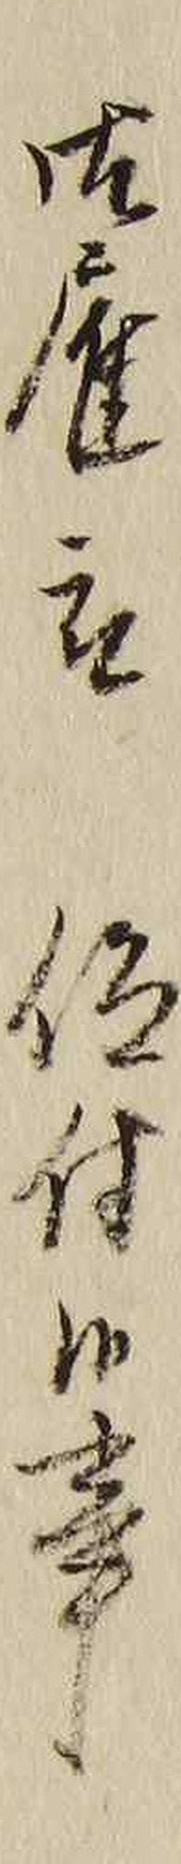御雇被仰付候事

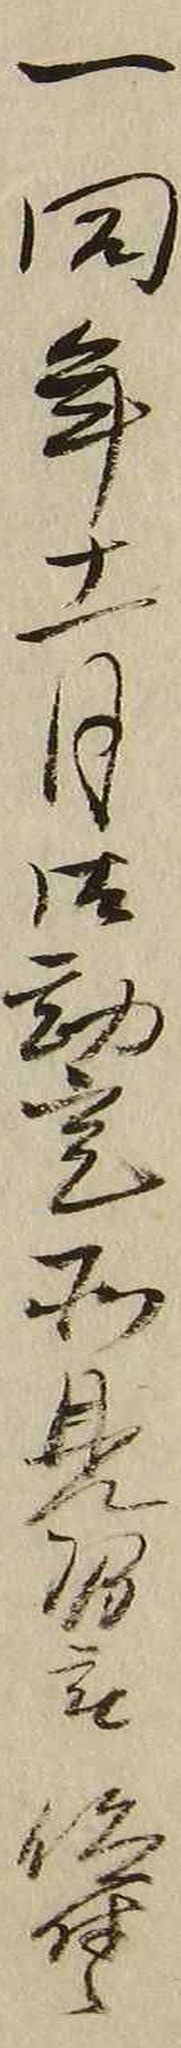一同年十一月御勘定所見習被仰付候
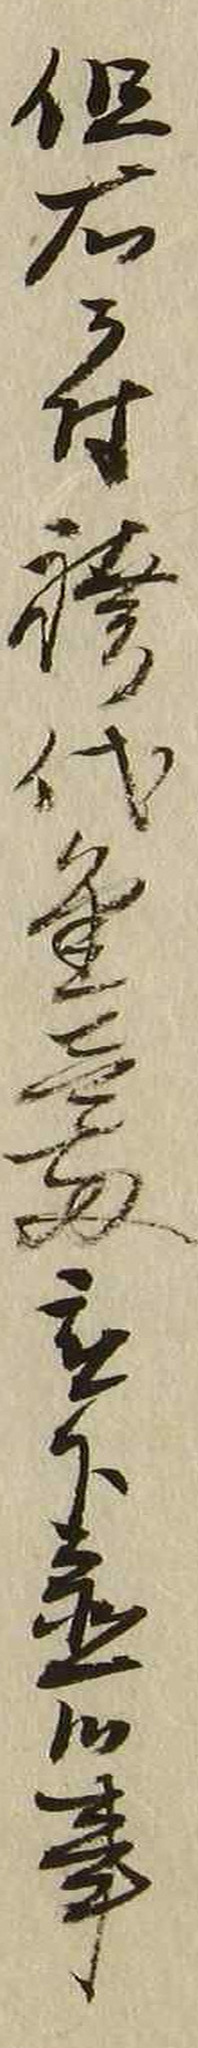但右付袴代金壱両被下置候事
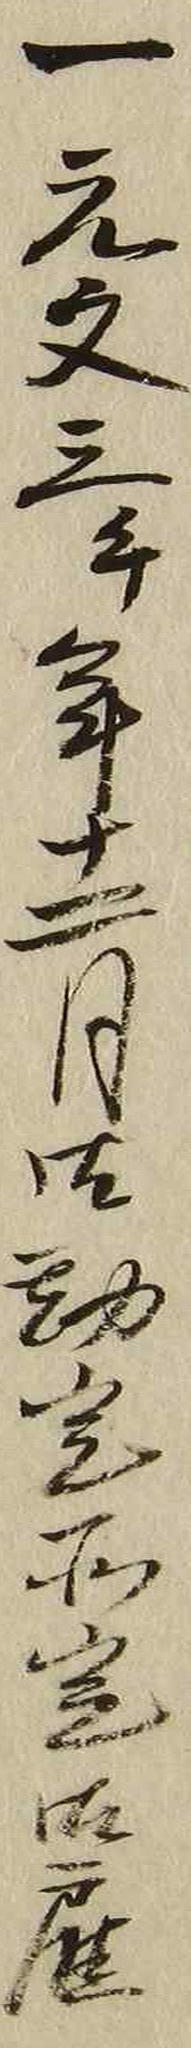一元文三午年十二月御勘定所定御雇
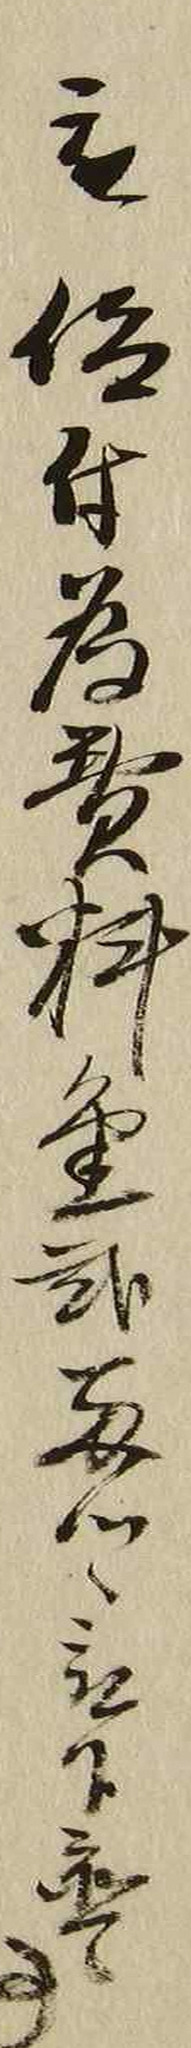被仰付為費料金弐両ツヽ被下置候事
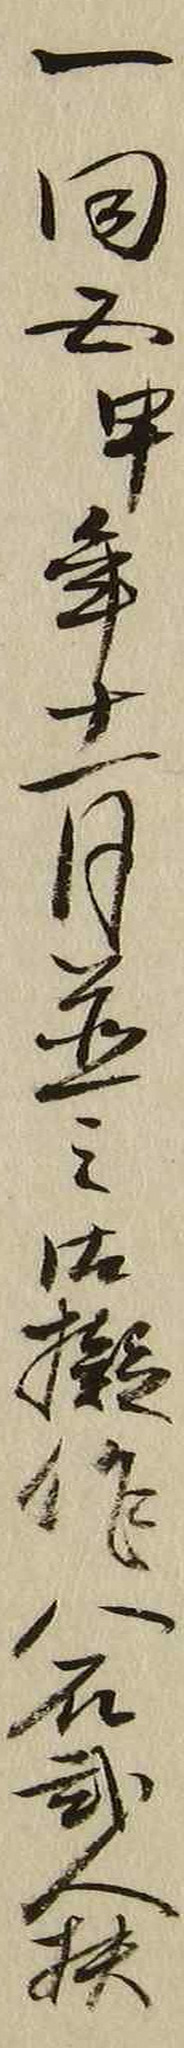一同五申年十一月並之御擬作八石弐人扶
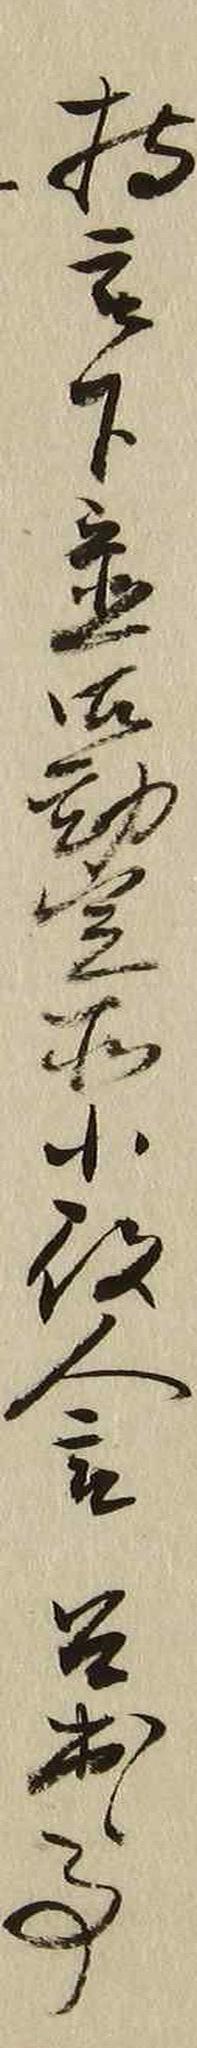持被下置御勘定所小役人被召出候事
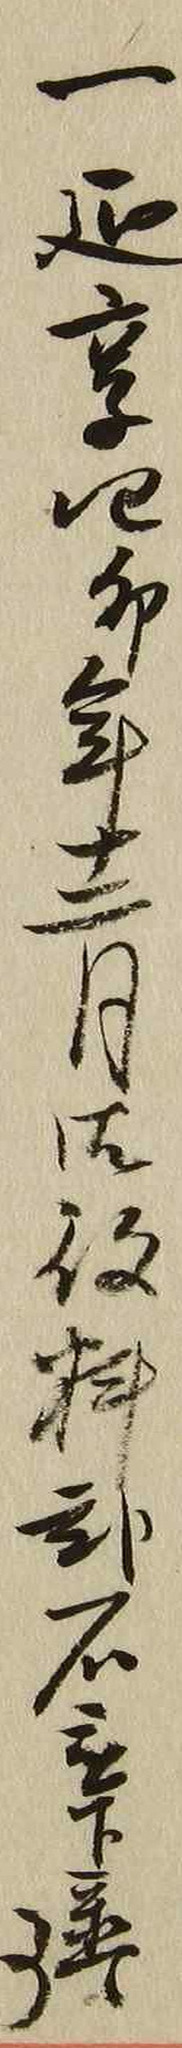一延享四卯年十二月御役料弐石被下置候事
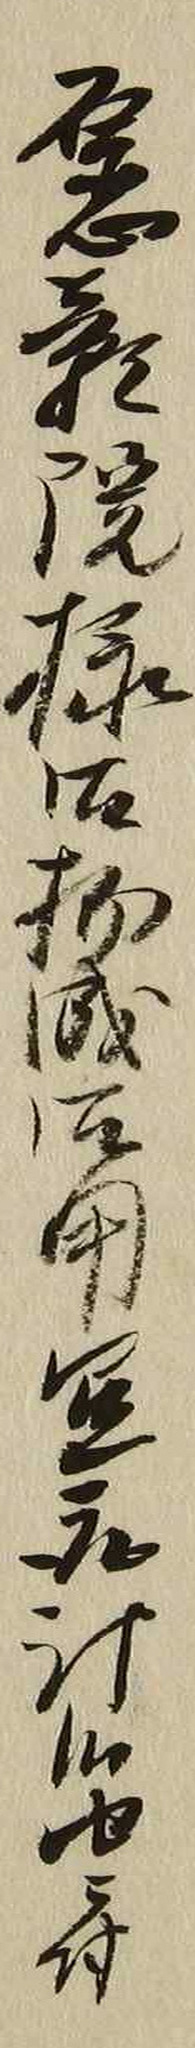愿彰院様御物成御用宜取計候由付
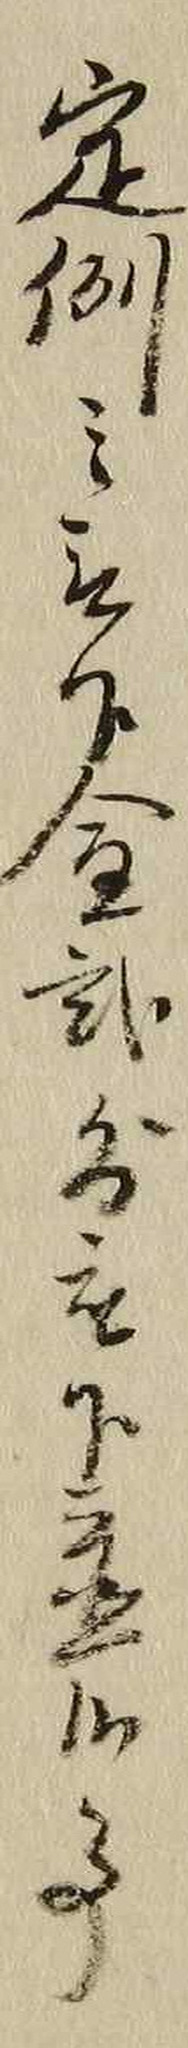定例之被下金弐分被下置候事
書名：諸士系譜　巻之350　せ之部1冊全
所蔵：会津若松市立会津図書館
